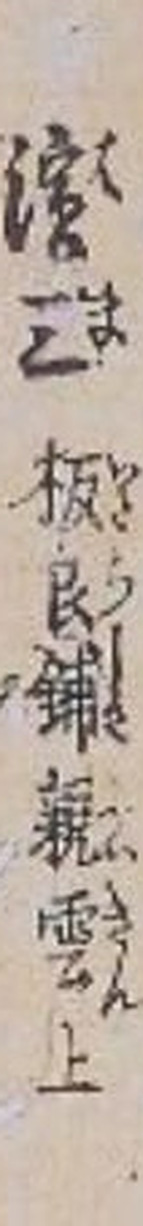濱元板良鋪親雲上
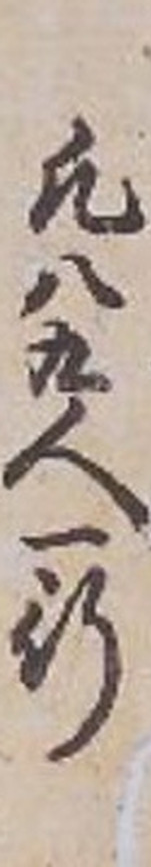凡八九人一行
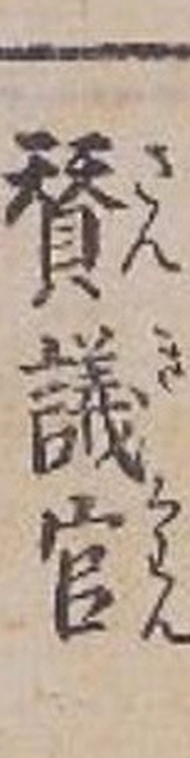賛議官
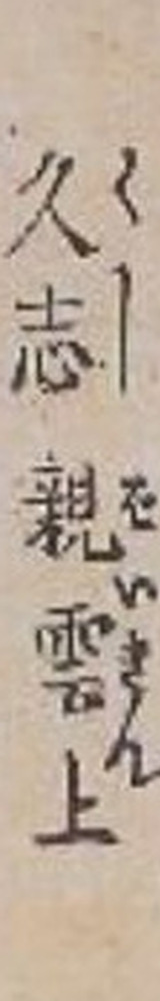久志親雲上
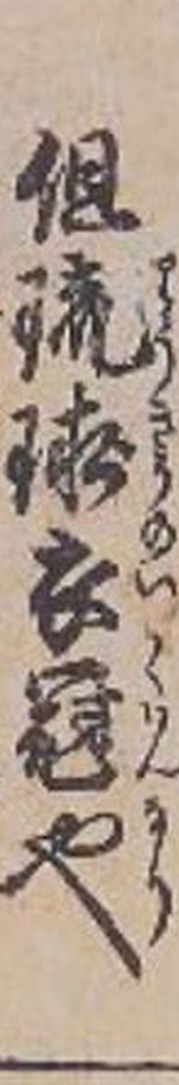但琉球衣冠也
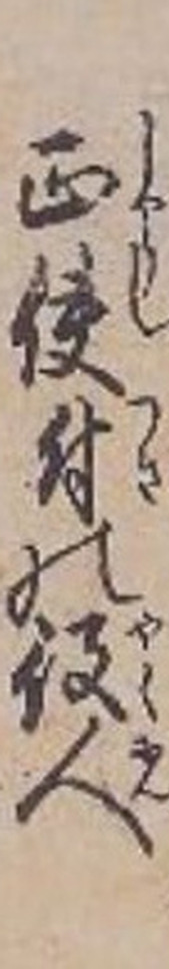正使付の役人

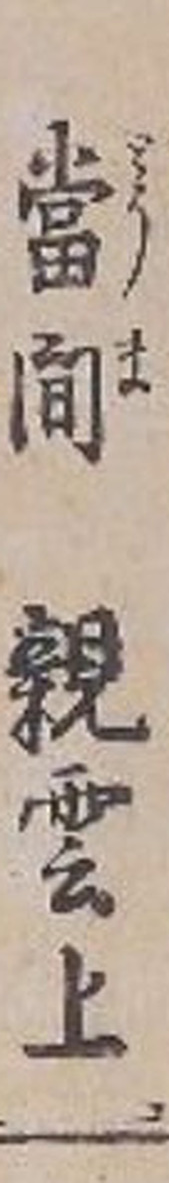當間親雲上
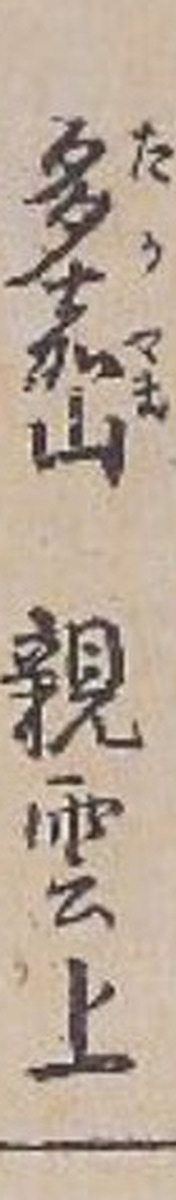多嘉山親雲上
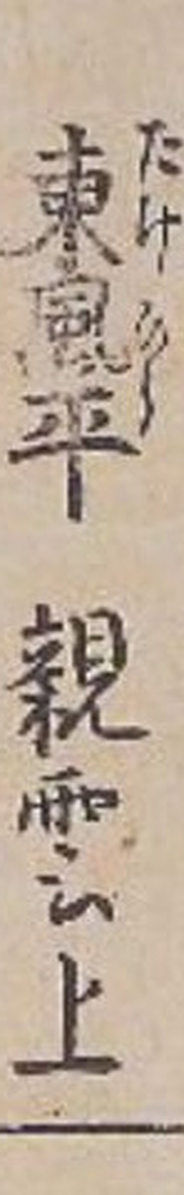東風平親雲上
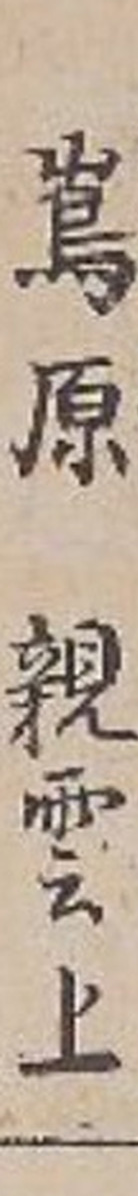嶌原親雲上
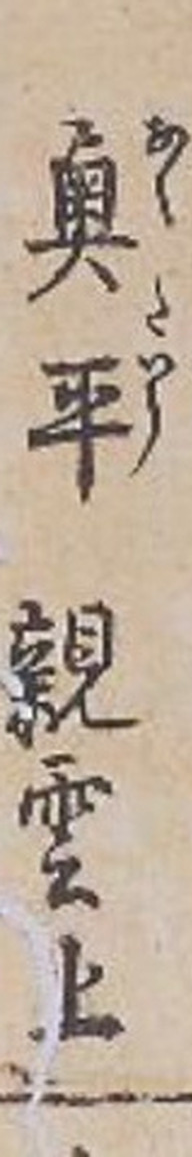奥平親雲上
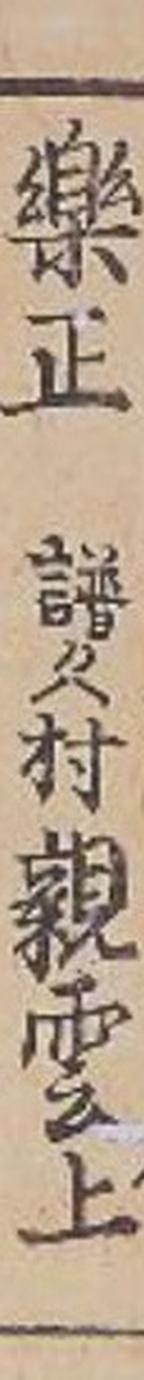楽正譜久村親雲上
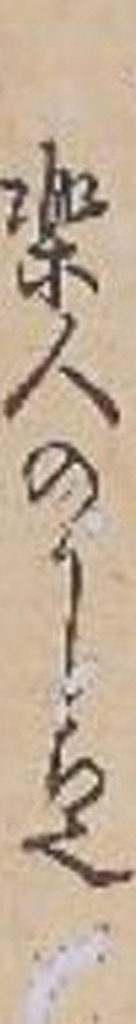楽人のかしら也
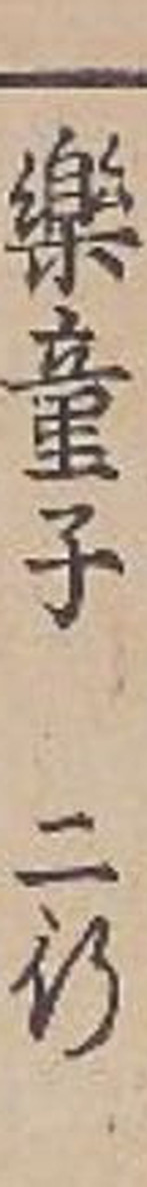楽童子二行
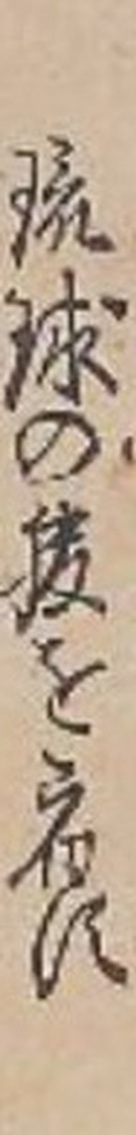琉球の服を着す
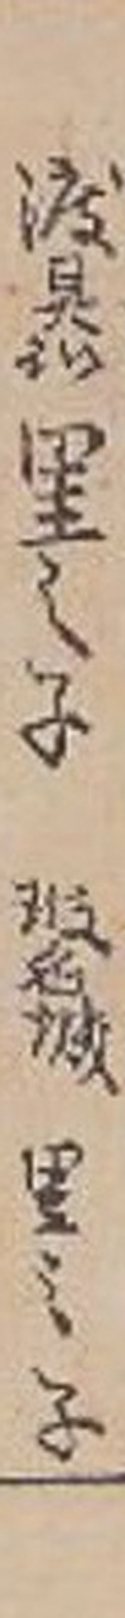渡具知里之子波名城里之子
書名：琉球人大行列記 来朝新板絵入
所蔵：University of the Ryukyus Library
